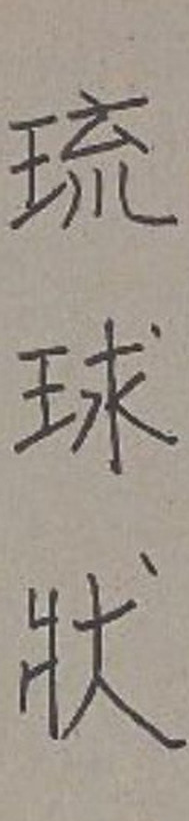琉球状
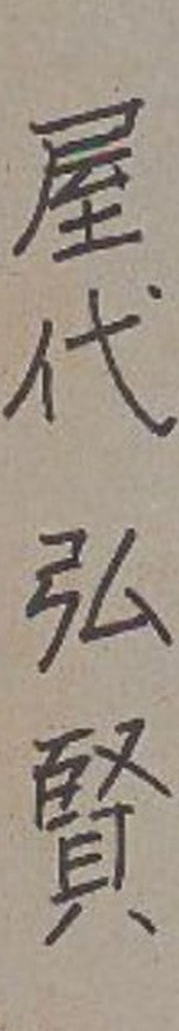屋代弘賢

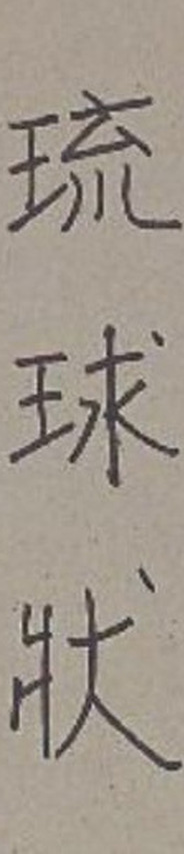琉球状
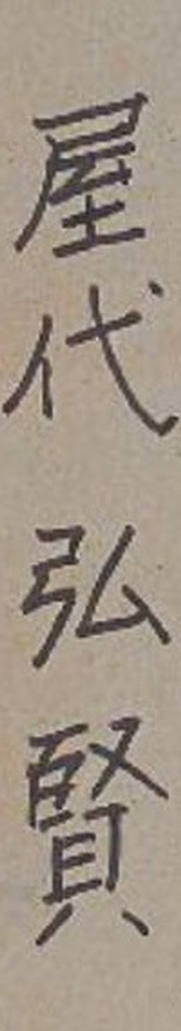屋代弘賢

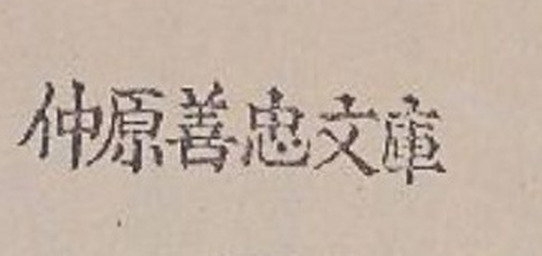仲原善忠文庫

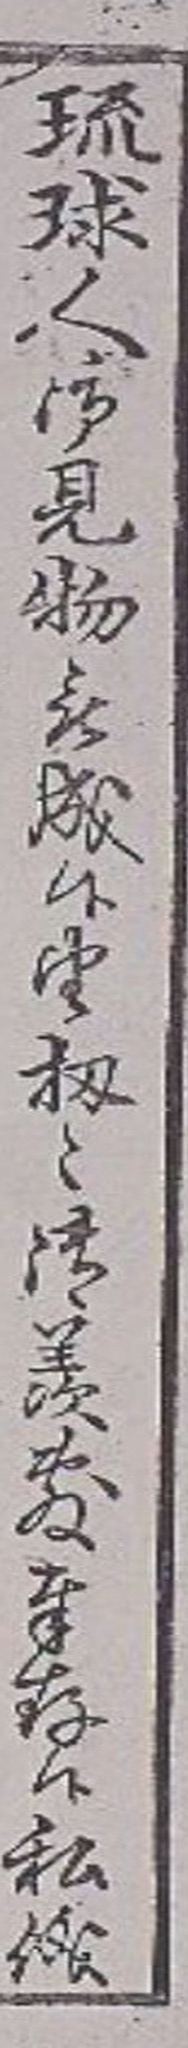琉球人御見物被成候由扨々御羨敷奉存候私儀
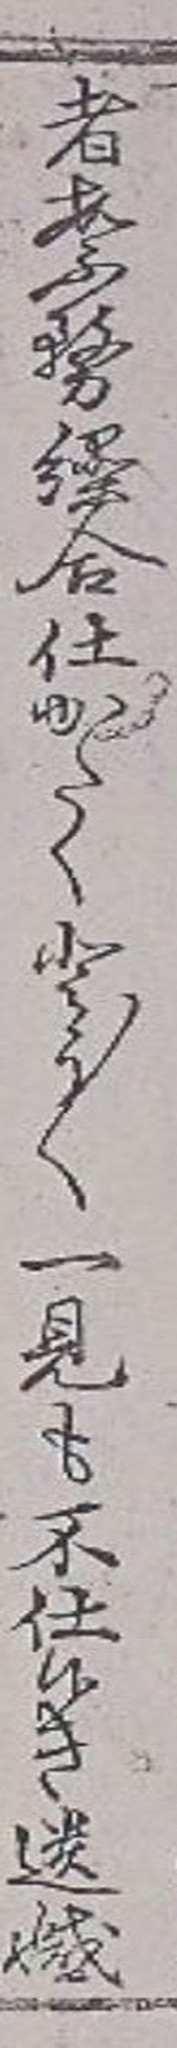は繁務繰合仕かたくとう〳〵一見も不仕候き遺憾
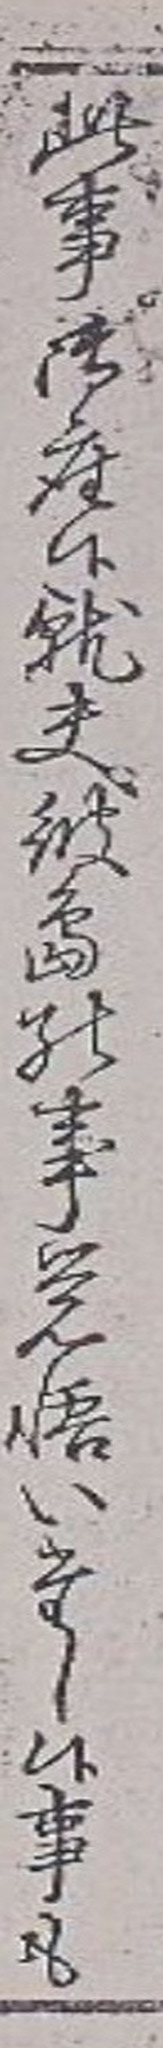此事御座候就夫彼島の事覚悟いたし候事も
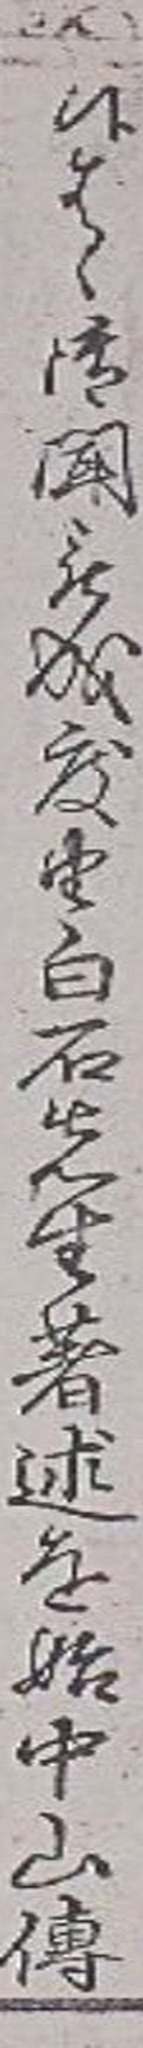候はゝ御聞被成度由白石先生著述を始中山伝
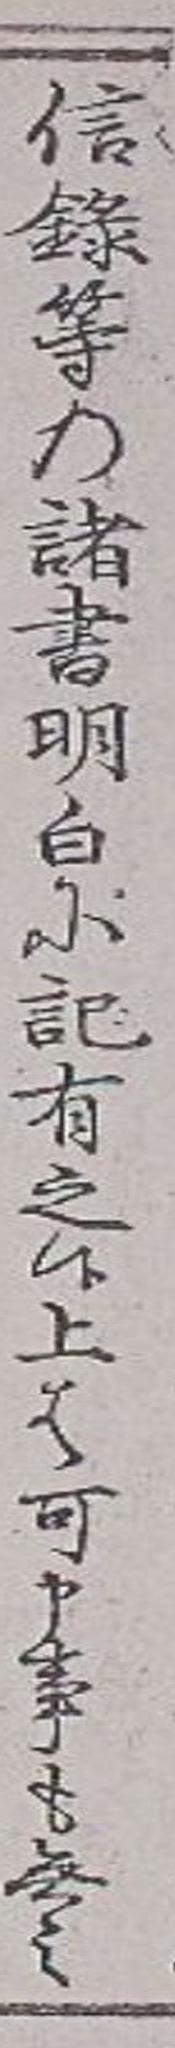信録等の諸書明白に記有之候上は可申事も無之
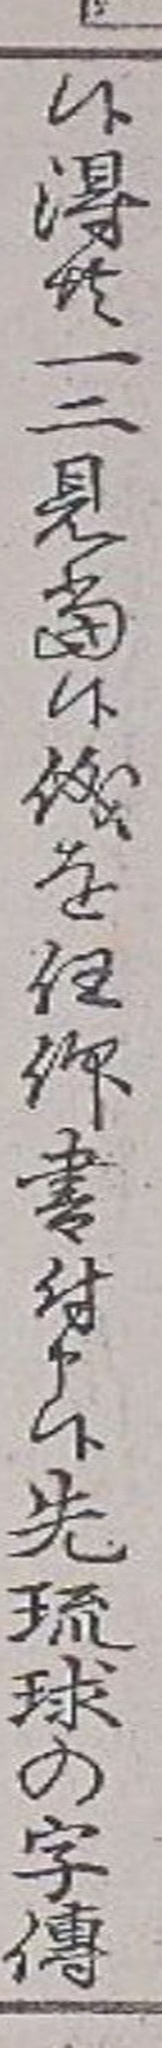候得共一二見当候儀を任仰書付申候先琉球の字伝
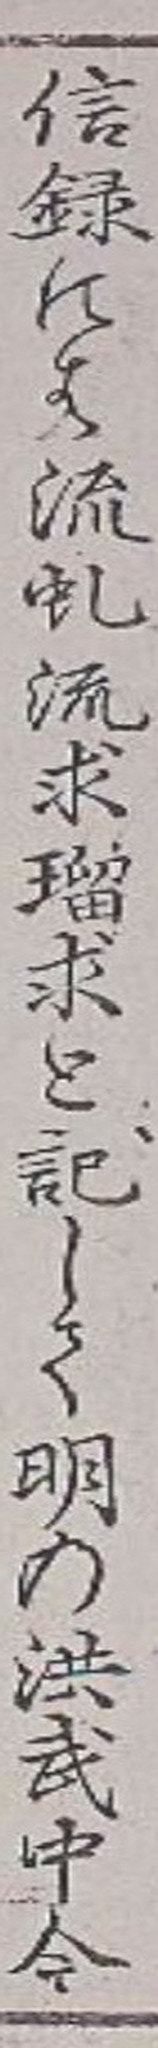信録には流虬流求瑠求と記し明の洪武中今
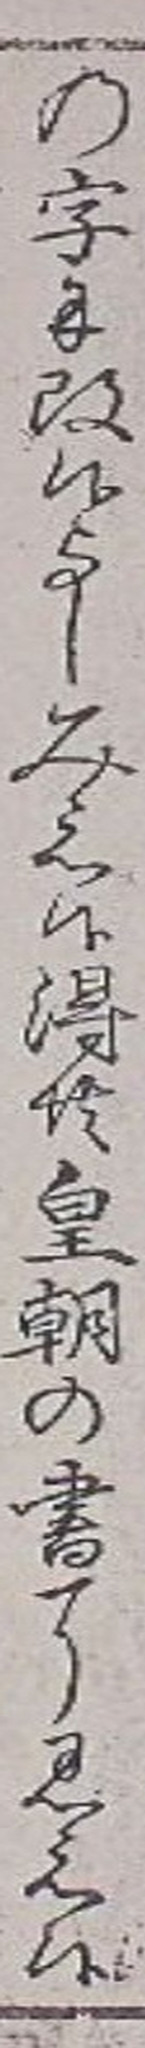の字に改候よしみえ候得共皇朝の書に見え候
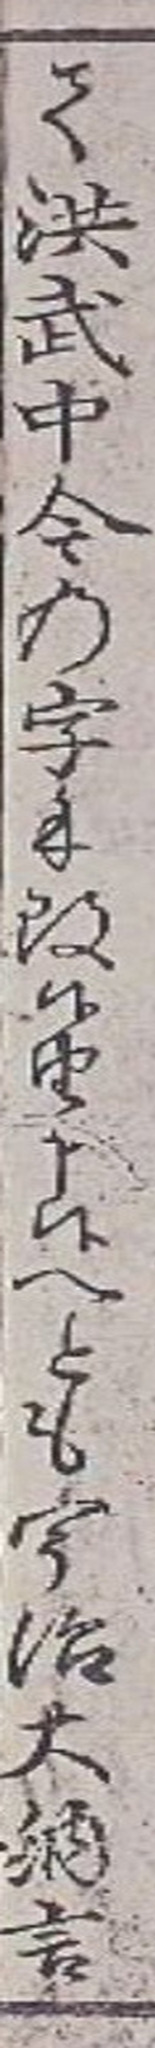て洪武中今の字に改候由申候へとも宇治大納言
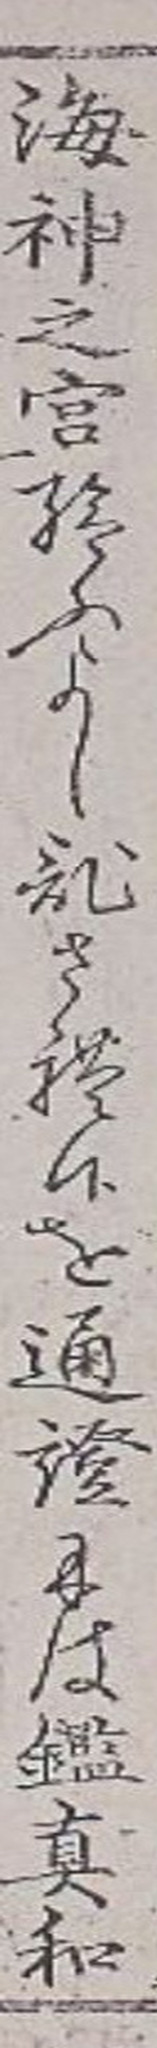海神之宮給ふよし記され候を通証には鑑真和
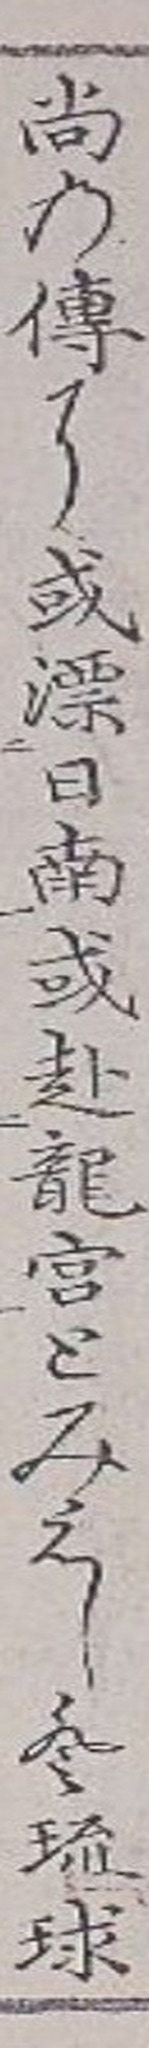尚の伝に或漂日南或赴竜宮とみえしと琉球
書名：琉球状
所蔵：University of the Ryukyus Library
